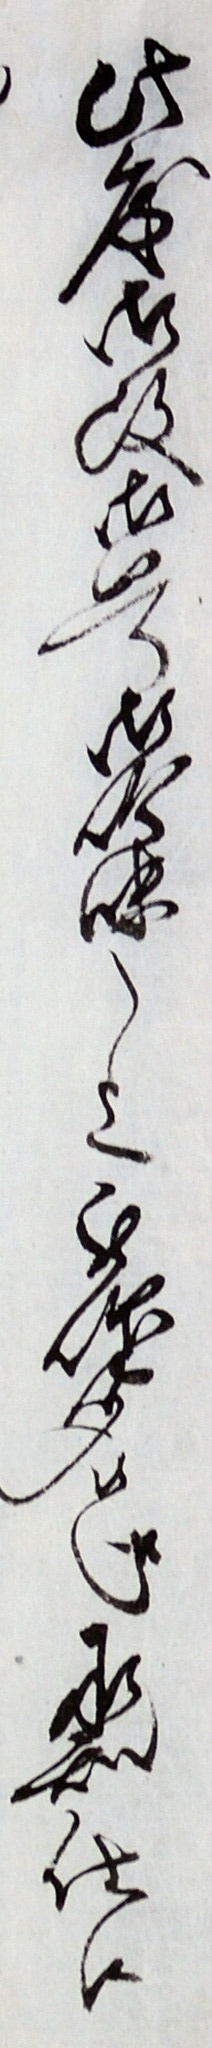此度御改御廻り御吟味之上被仰聞候趣承知仕候
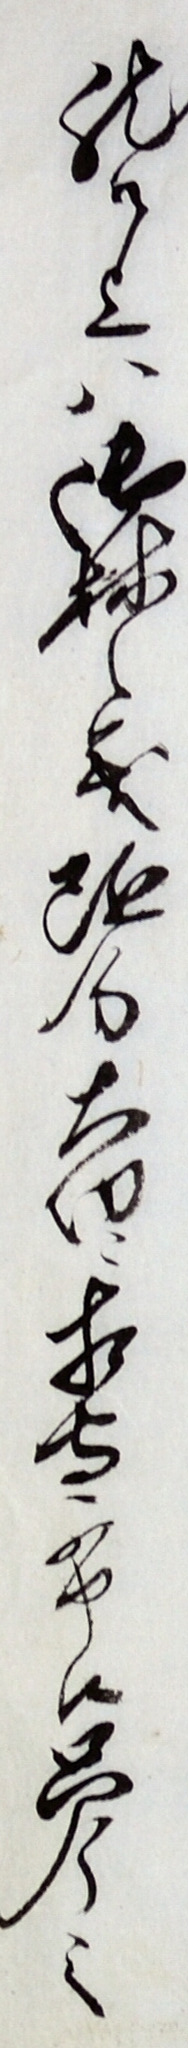然ル上ハ御林之義随分大切ニ相守可申候只今之

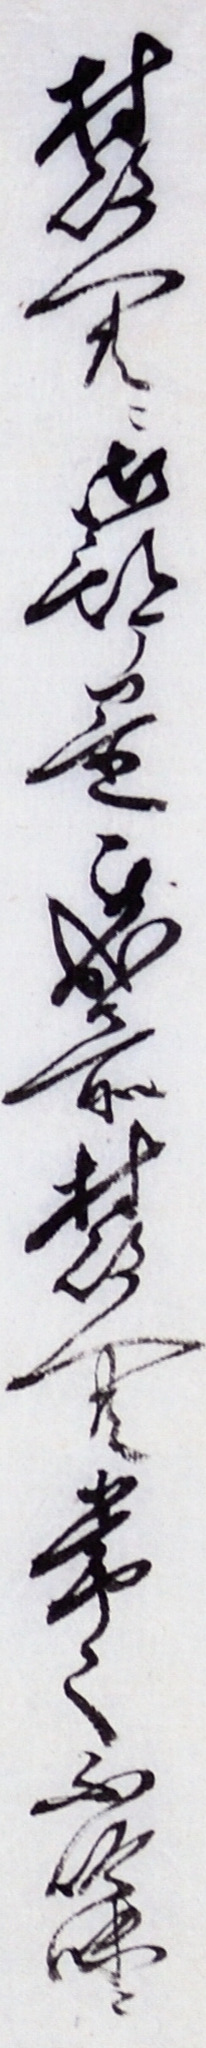村役人共ニ御預ヶ置被成候所村役人共常々不吟味ニ
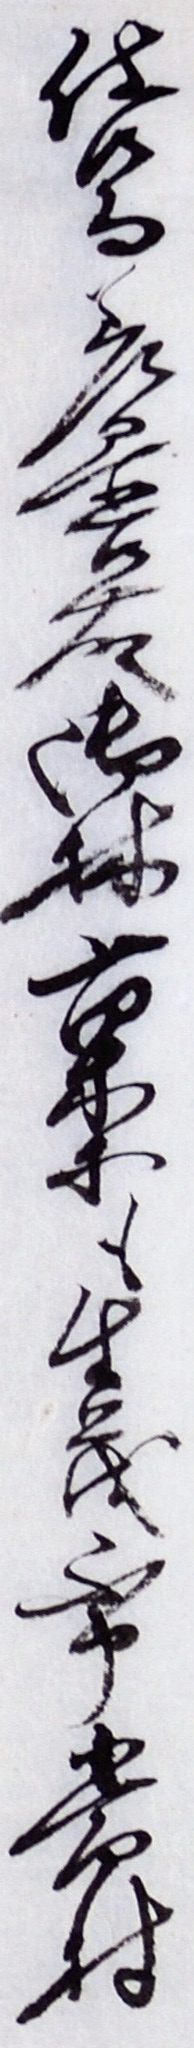仕候而差置候故御林苗木等も生茂不申当村
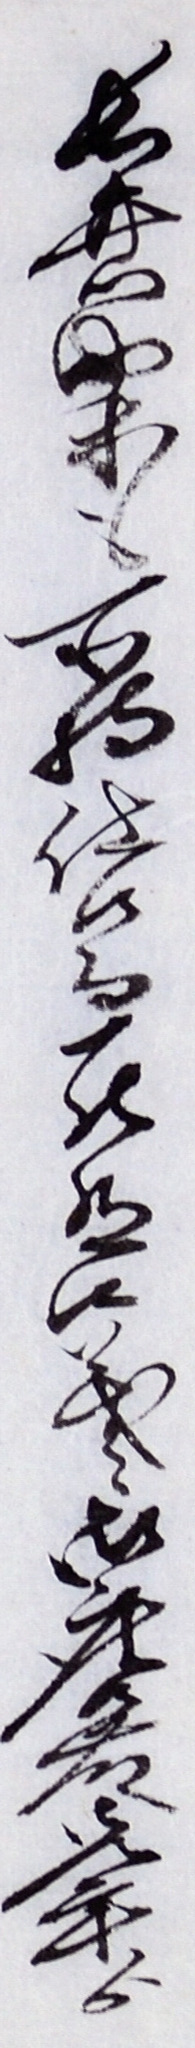長井筋等も所持仕候而罷有候義ニ御座候故先年ゟ
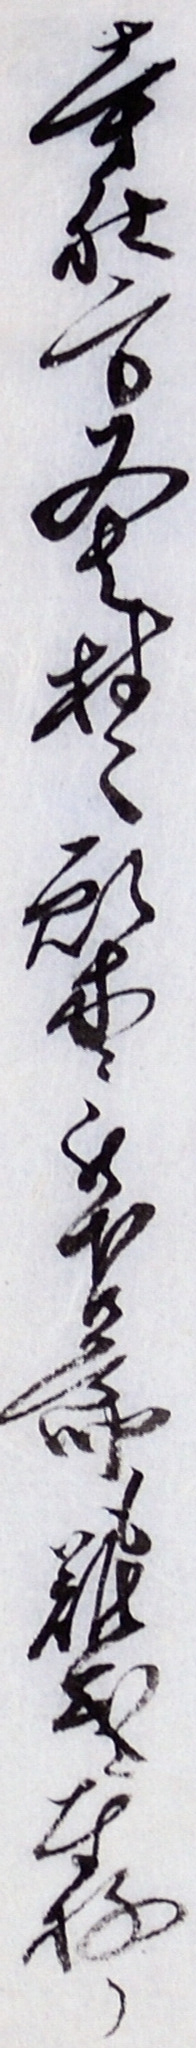寺社方又は村々預木ニ被下候節も難義と奉存候
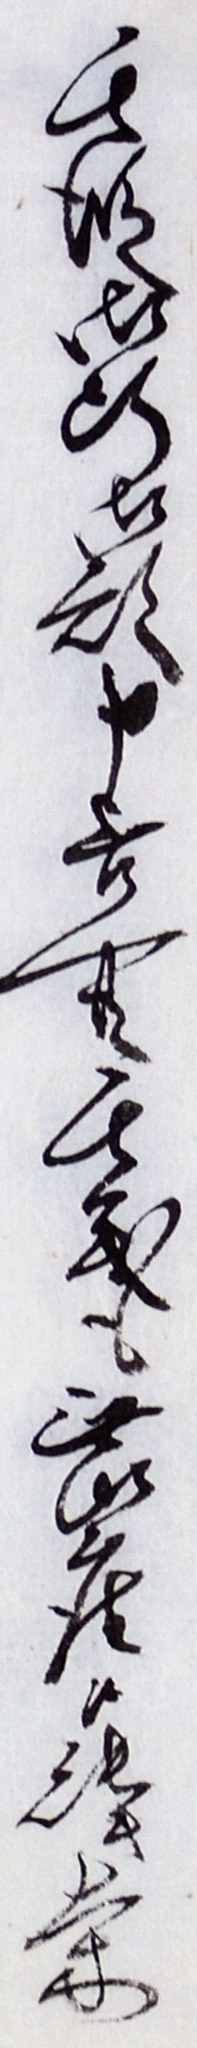其段御断御願申上候へ共其義も無御座候能キ大木
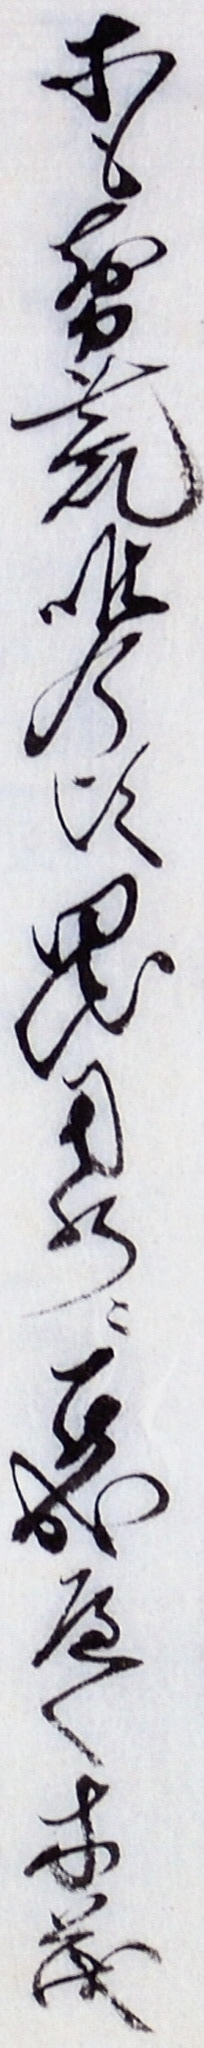等も剪荒唯今頃田地用水ニ罷成へく木茂
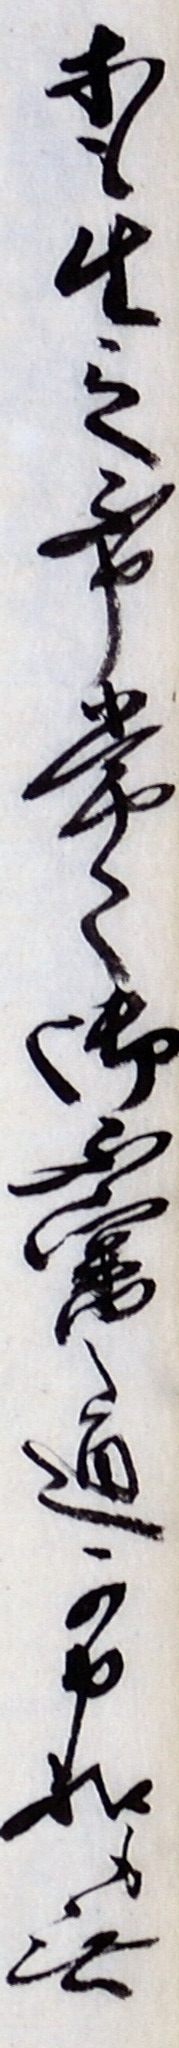等も生立不申常々御不審之通可申様も無
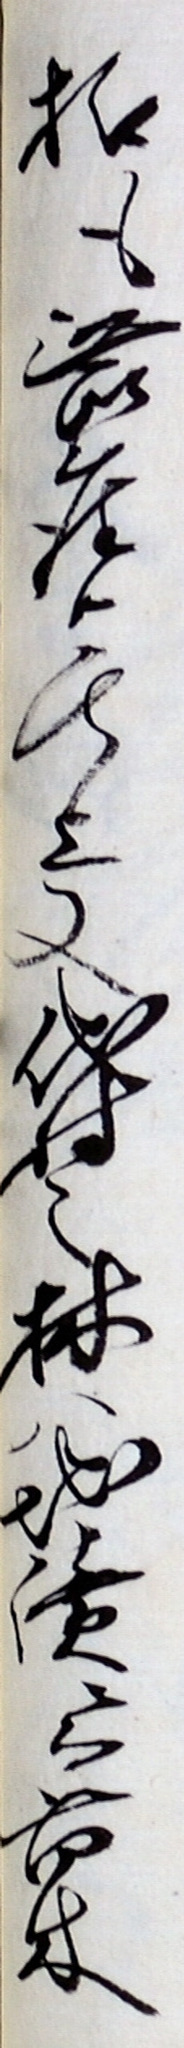様も無御座候其上又他村之林ハ地続ニ而苗木
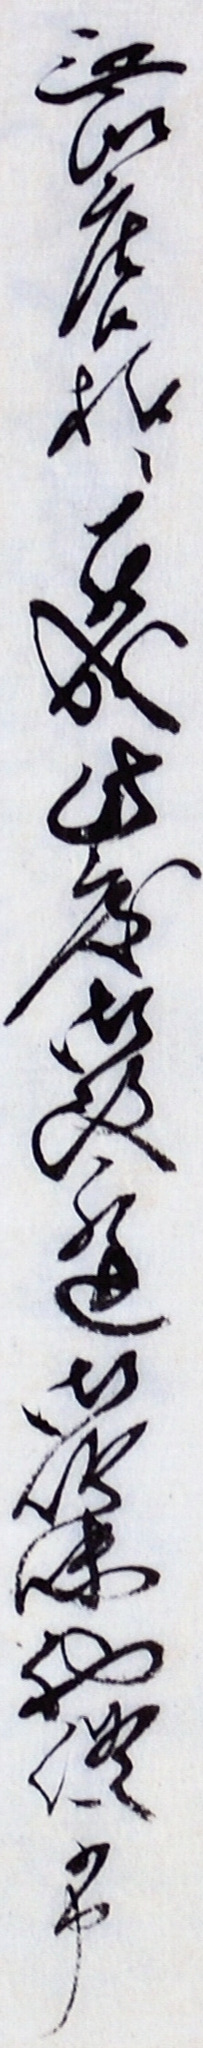無御座候様ニ罷成此度御改逢御吟味可申
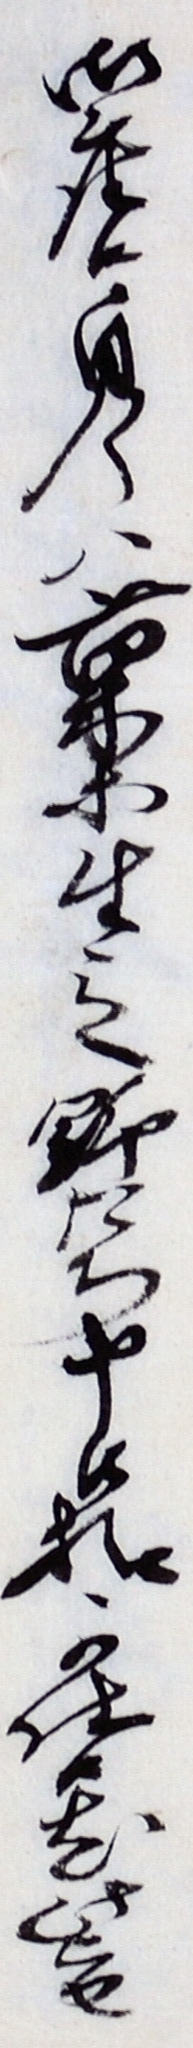御座候自今ハ苗木等生立野たち申候様可仕候尤此旨
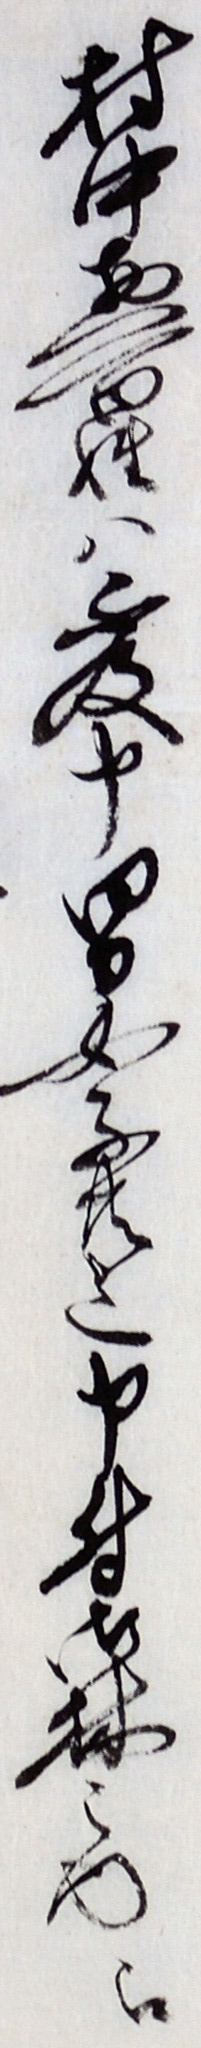村中惣百姓ハ不及申男女子共迄申付御林之内え
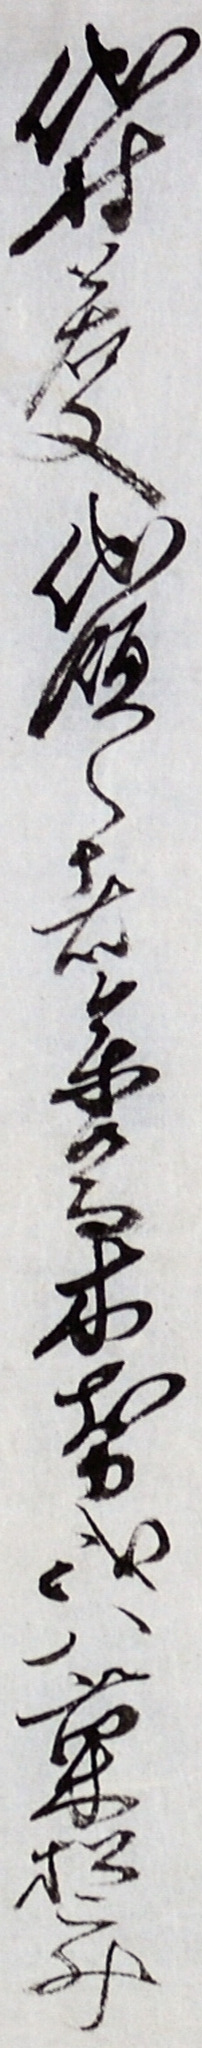他村若又他領之者参候而木剪或ハ苗木松こみ
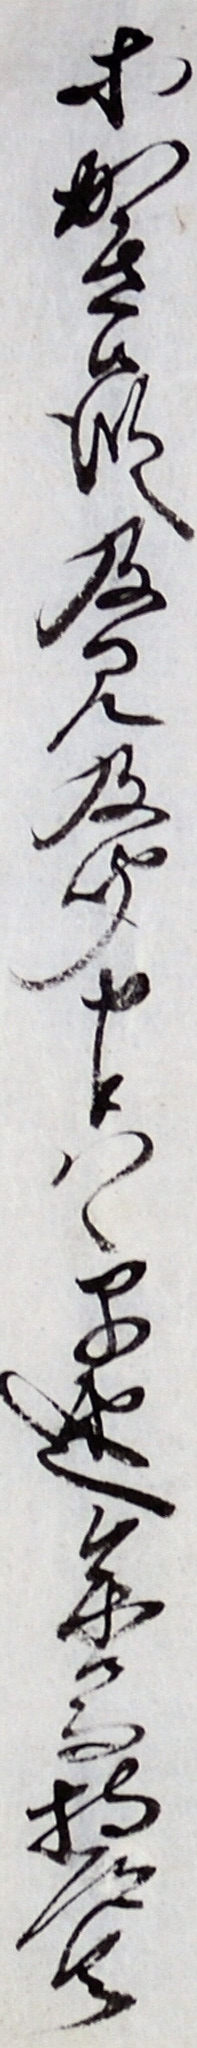等かき候段及見及聞申候ハヽ早速参候而持道具
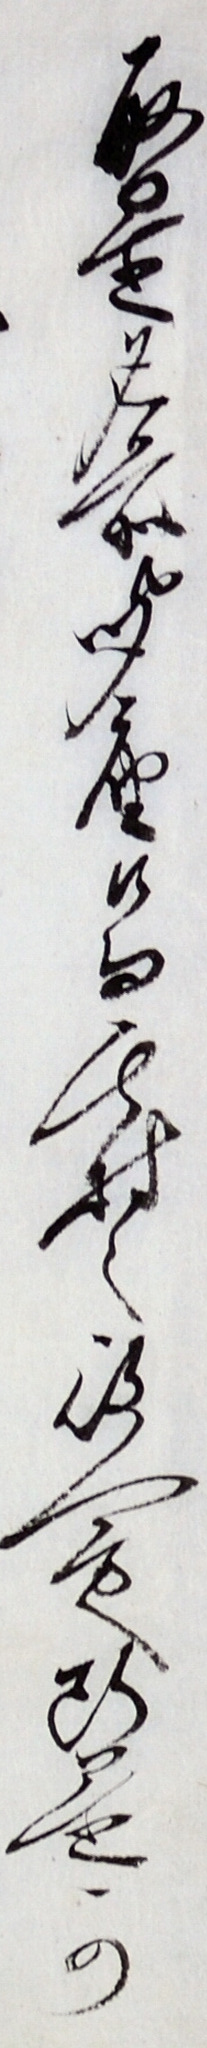取置名前聞届候而其村之役人方へ断置可
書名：御林御竹藪証文控
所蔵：伊那市立高遠町図書館・合同会社AMANE
